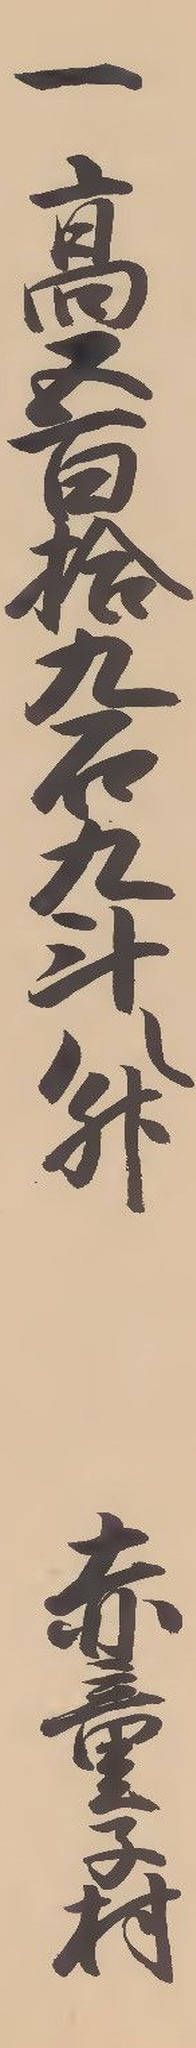一高五百拾九石九斗八升赤童子村
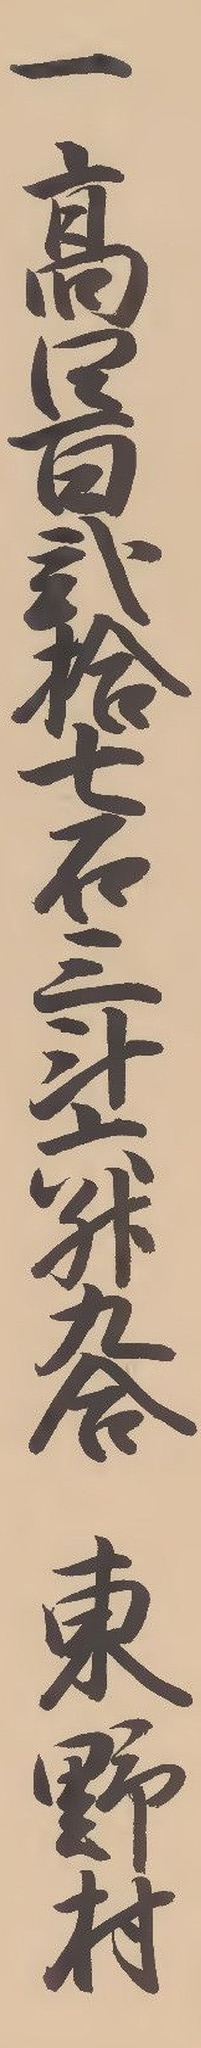一高四百弐拾七石三斗六升九合東野村
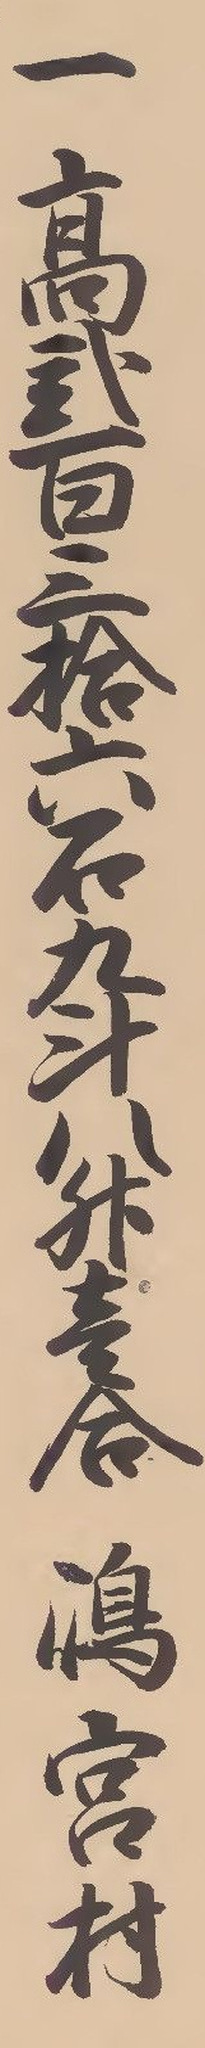一高弐百三拾六石九斗八升壱合島宮村

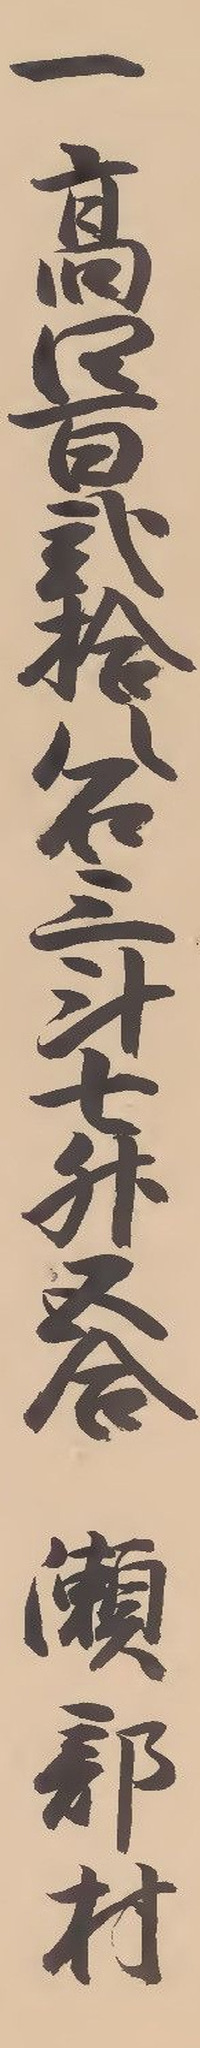一高四百弐拾八石三斗七升五合瀬部村
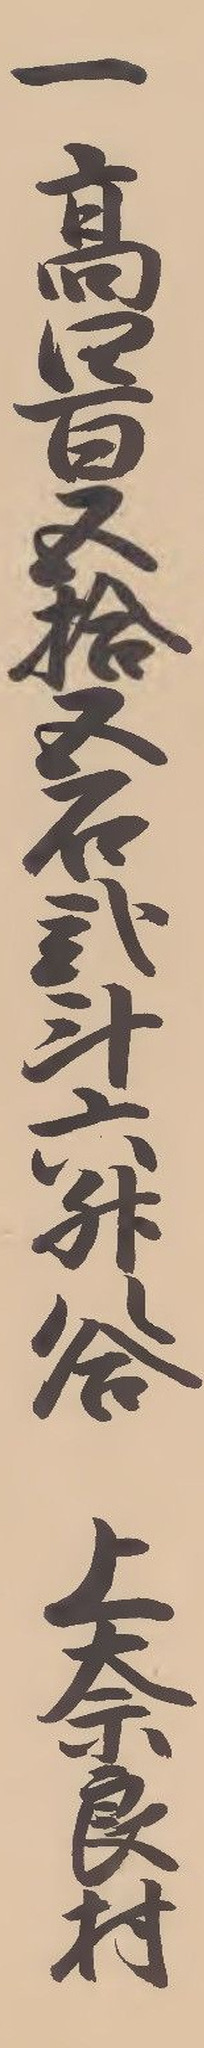一高四百五拾五石弐斗六升八合上奈良村
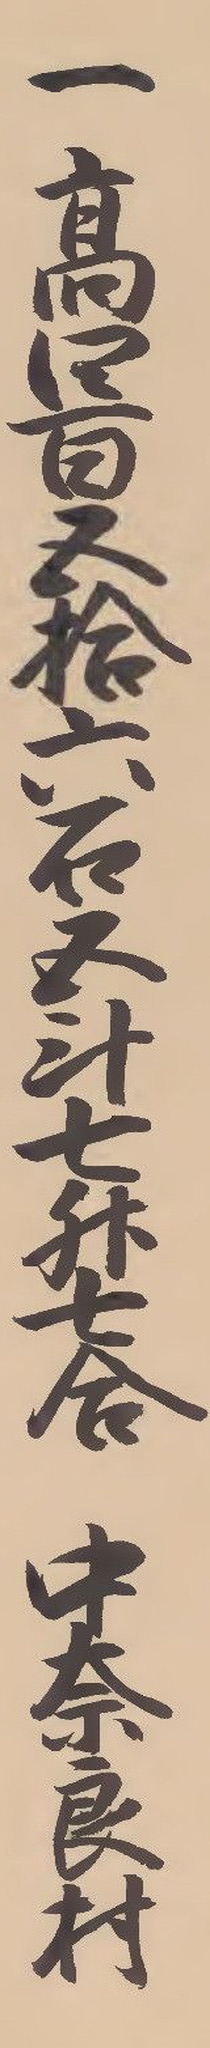一高四百五拾六石五斗七升七合中奈良村
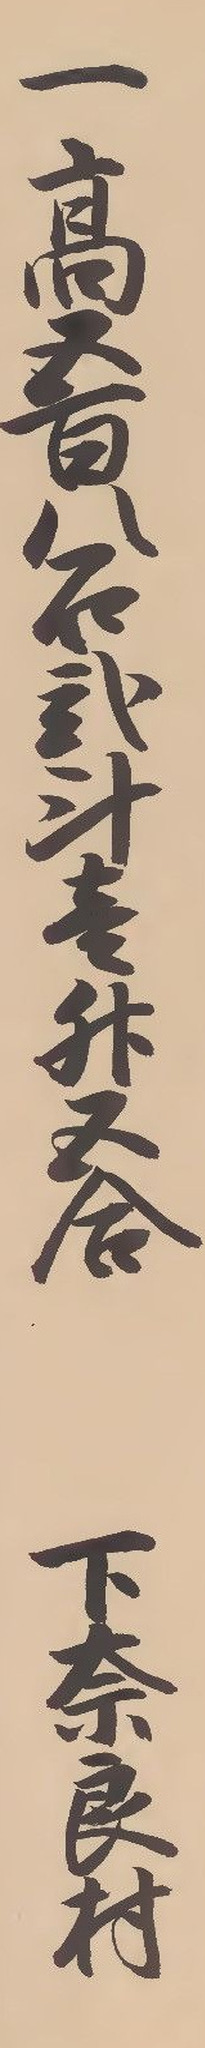一高五百八石弐斗壱升五合下奈良村
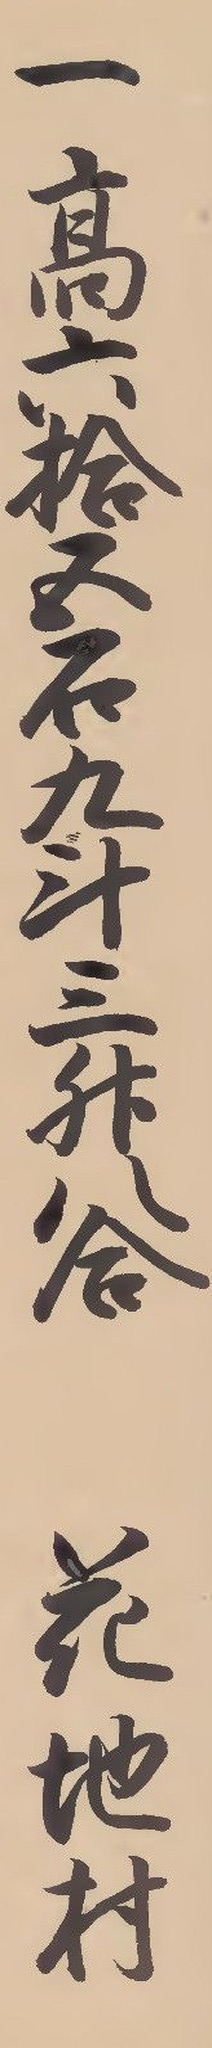一高六拾五石九斗三升八合花地村
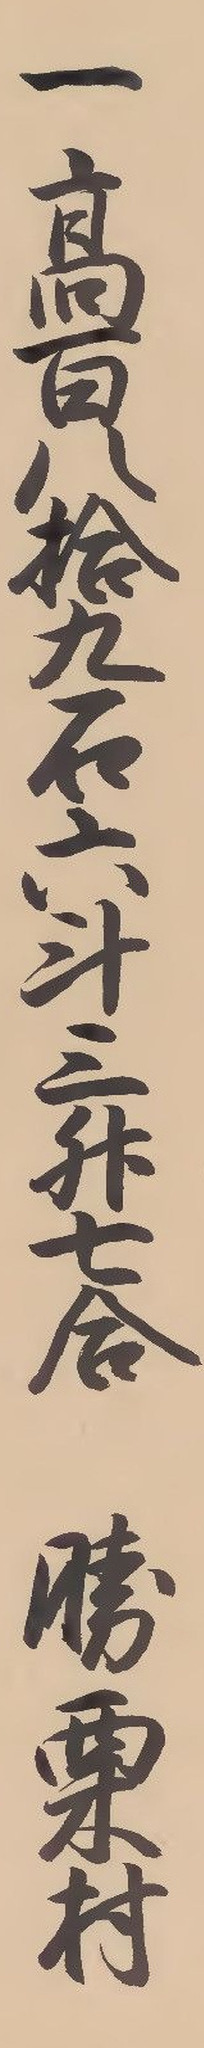一高百八拾九石六斗三升七合勝栗村
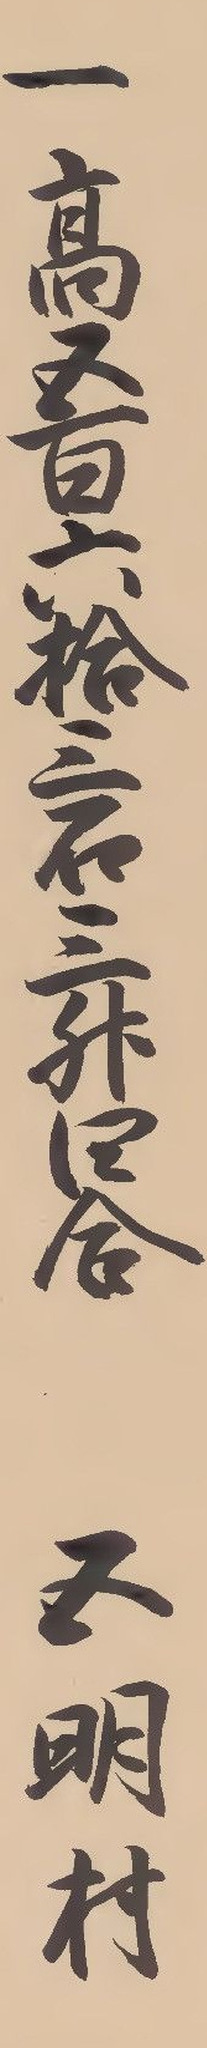一高五百六拾三石三升四合五明村
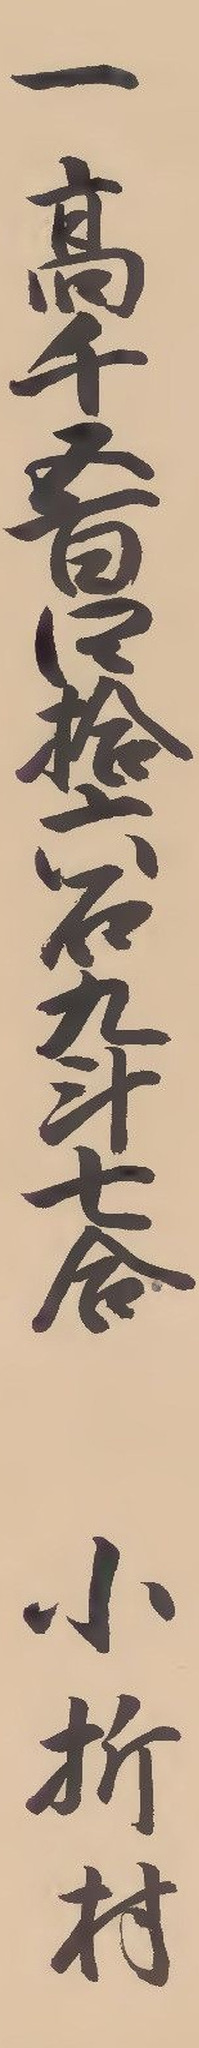一高千五四拾六石九斗七合小折村

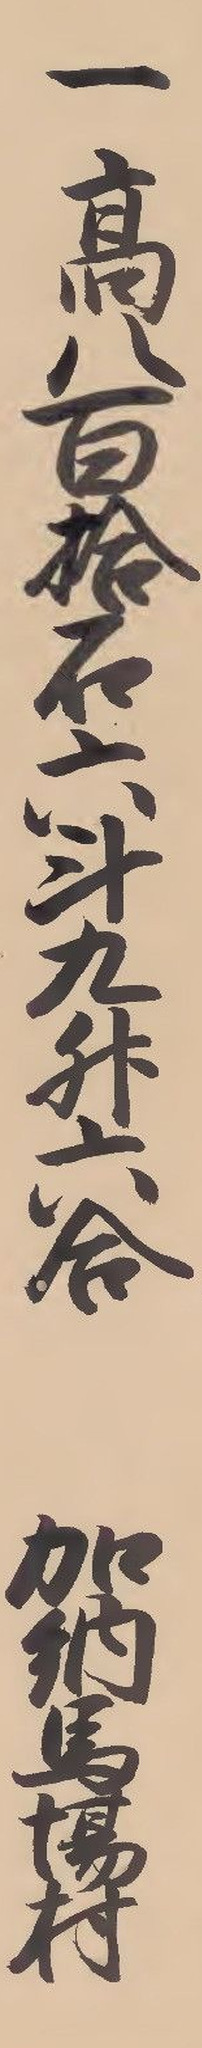一高八百拾石六斗九升六合加納馬場村
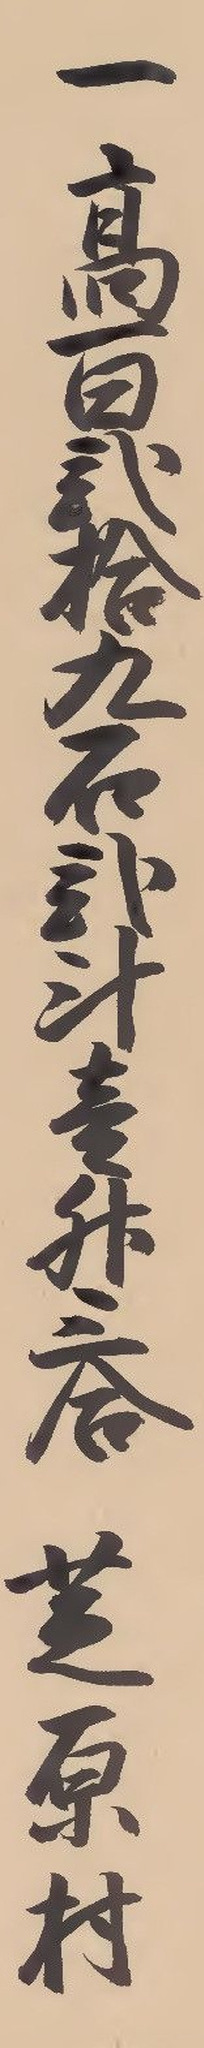一高百弐拾九石弐斗壱升三合芝原村
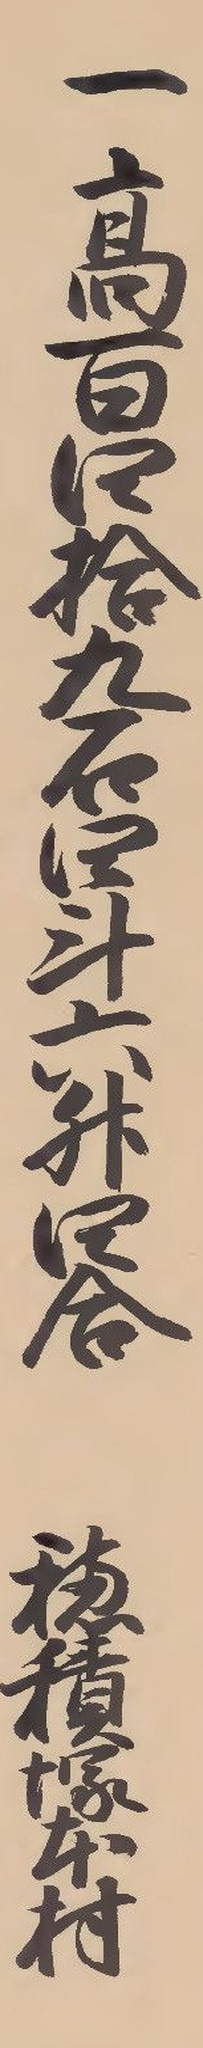一高百四拾九石四斗六升四合穂積塚本村
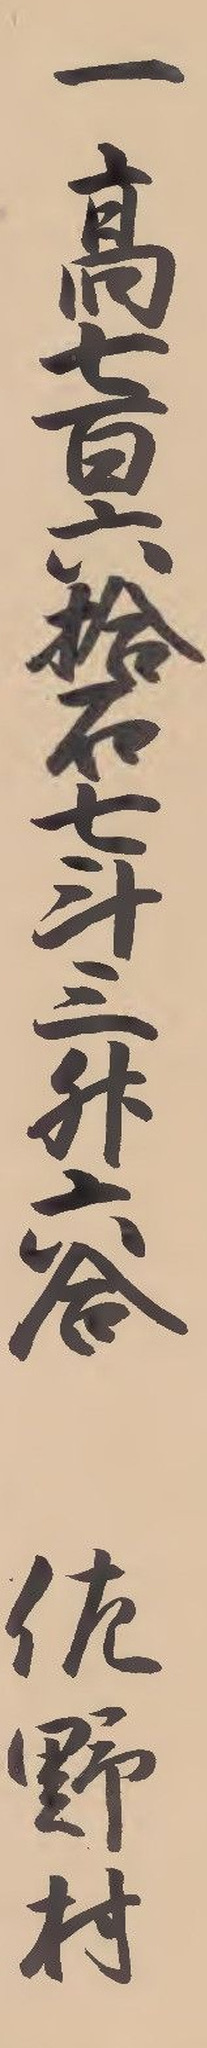一高七百六拾石七斗三升六合佐野村
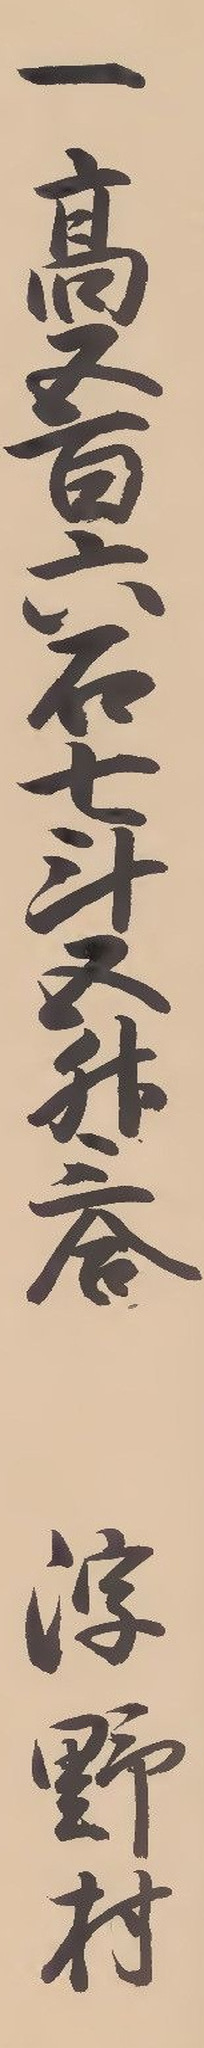一高五百六石七斗五升三合浮野村
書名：尾張国郷帳
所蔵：国立公文書館 National Archives of Japan
